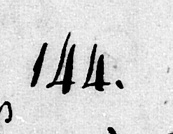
1440.
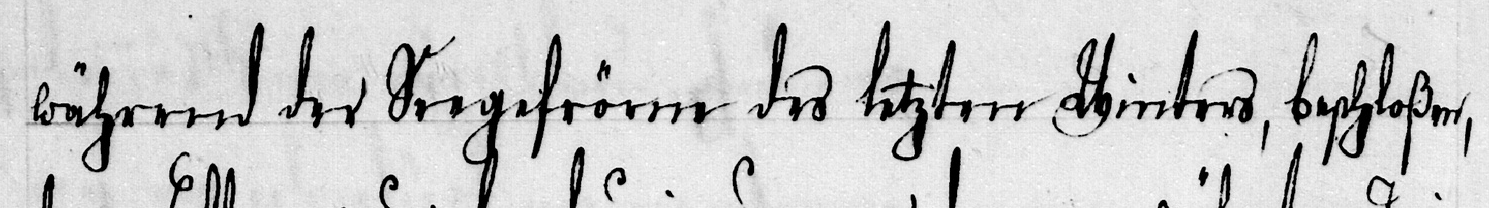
während der Seegefrörne des letzten Winters, beschloße¬
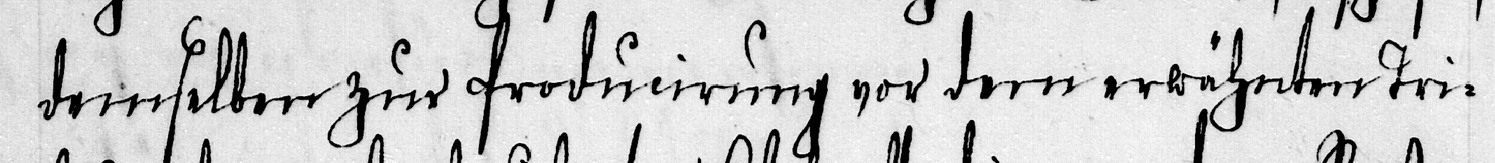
demselben zur Producirung vor dem erwähnten Tri¬
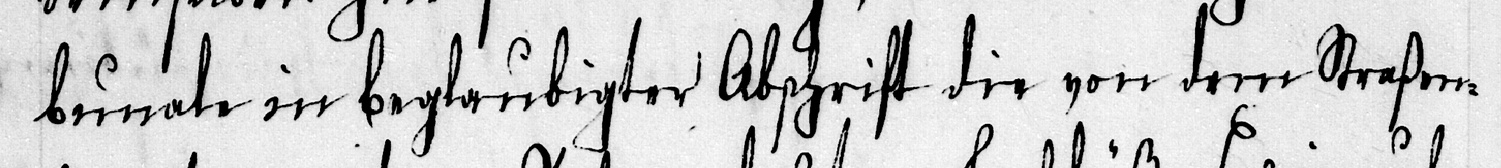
bunale in beglaubigter Abschrift die von dem Straßen¬
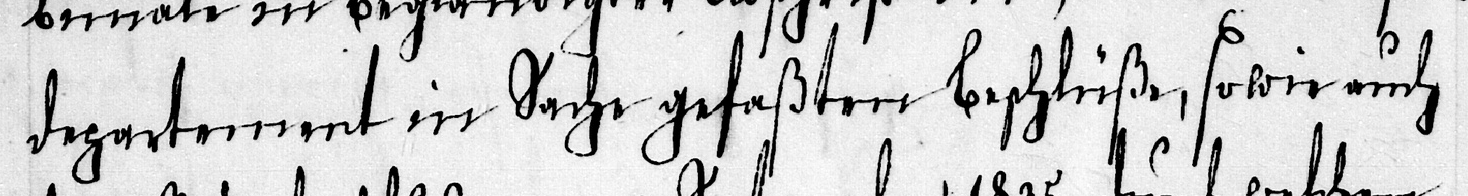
departement in Sache gefaßten Beschlüße, sowie auch
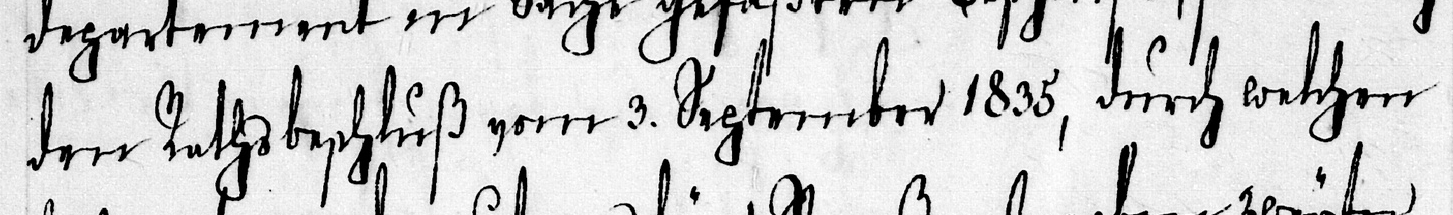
den Rathsbeschluß vom 3. September 1835, durch welchen
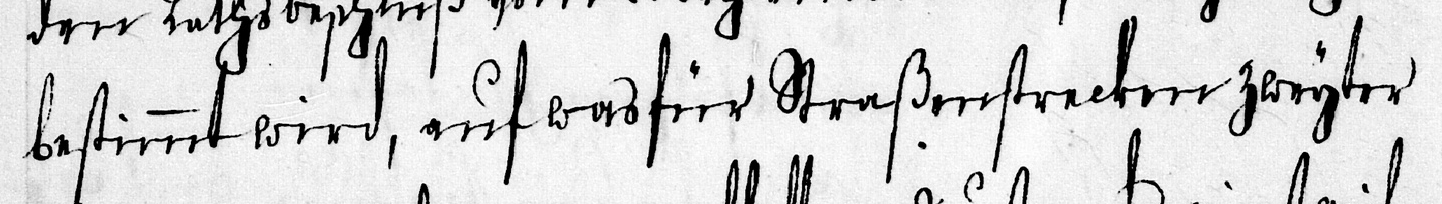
bestimmt wird, auf was für Straßenstrecken zweyter
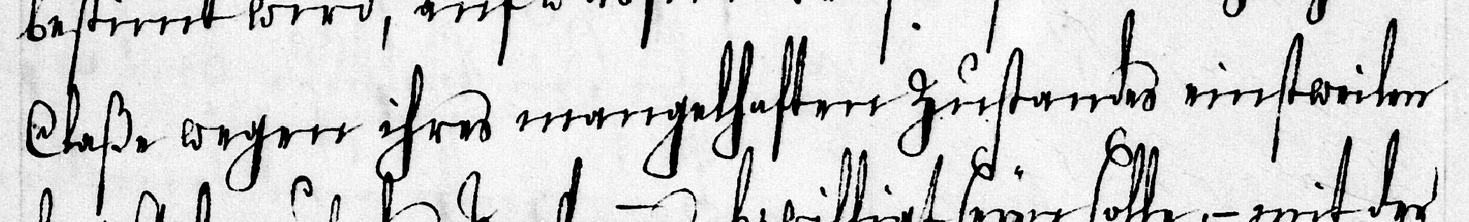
Claße wegen ihres mangelhaften Zustandes einstweilen
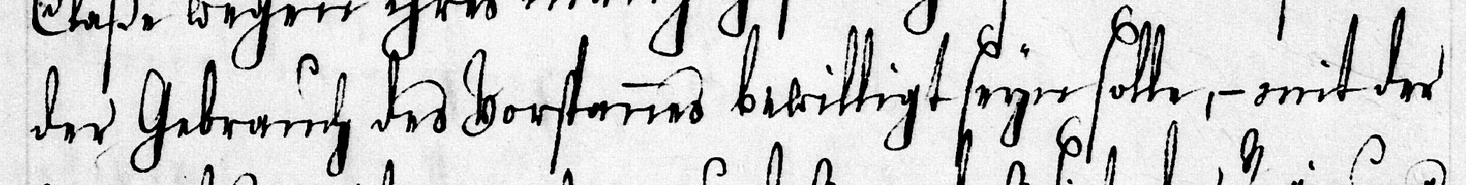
der Gebrauch des Vorspannes bewilligt seyn solle, – mit der
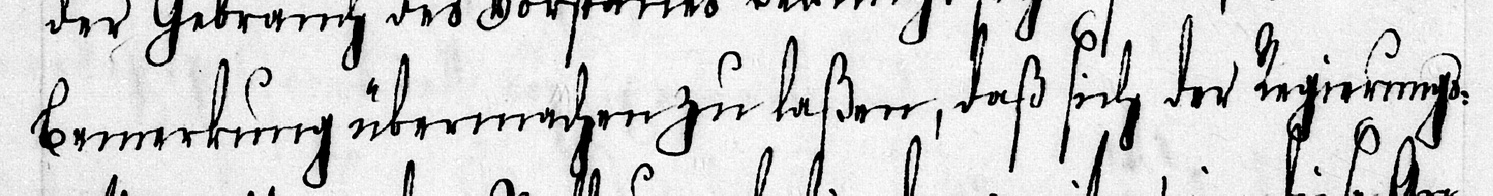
Bemerkung übermachen zu laßen, daß sich der Regierung¬
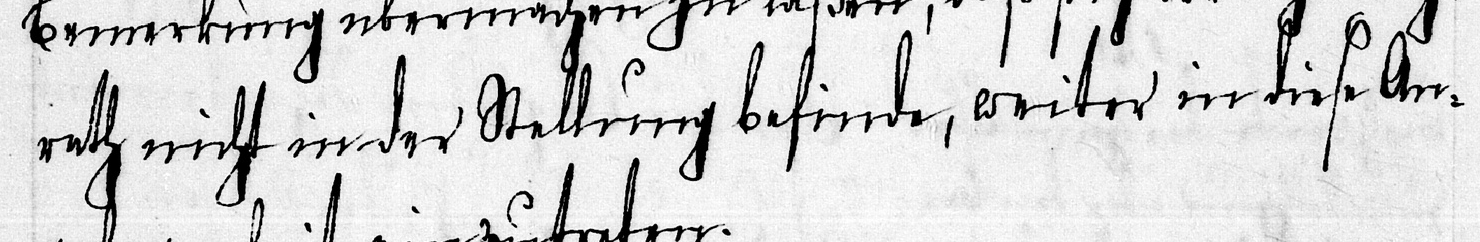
srath nicht in der Stellung befinde, weiter in diese An¬
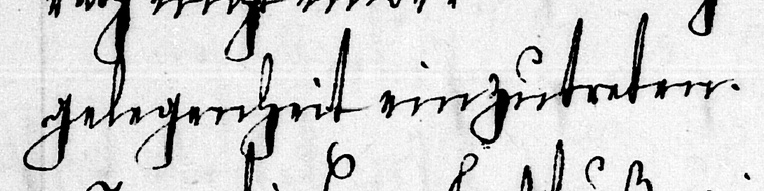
gelegenheit einzutreten.
